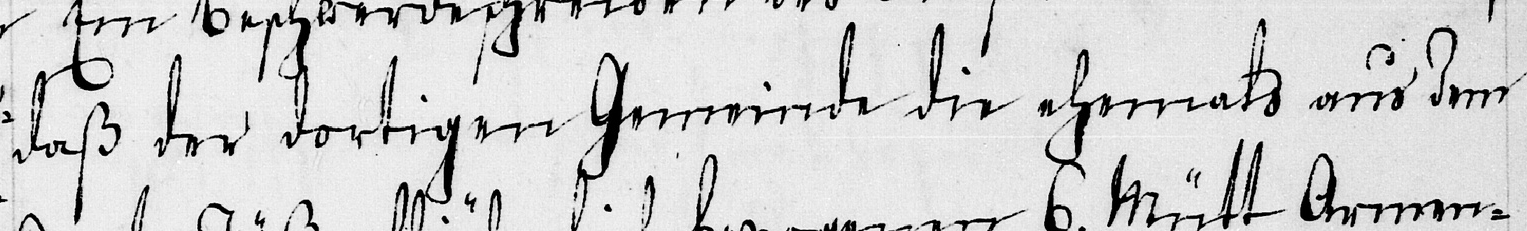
daß der dortigen Gemeinde die ehemals aus dem
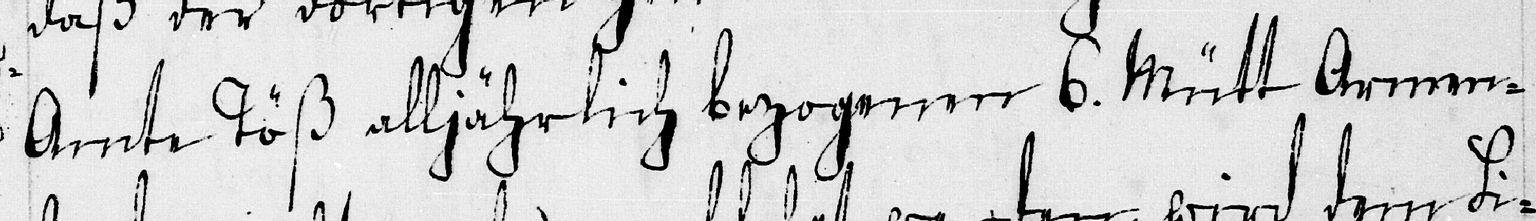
Amte Töß alljährlich bezogenen 6. Mütt Armen¬
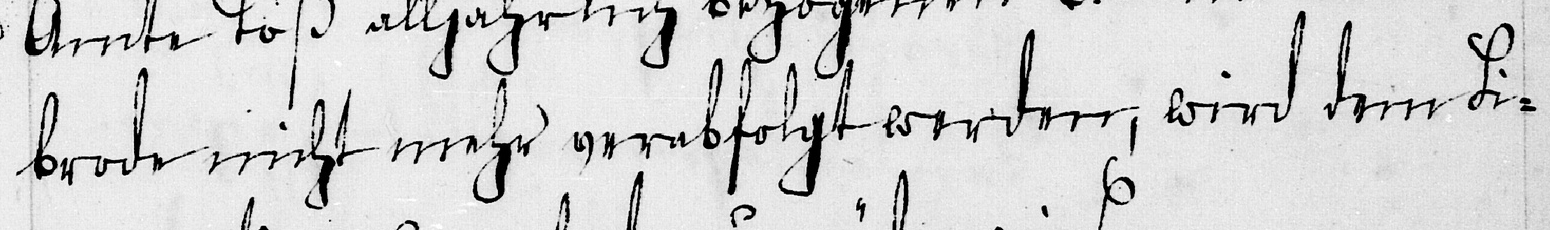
brode nicht mehr verabfolgt werden, wird dem Fi¬
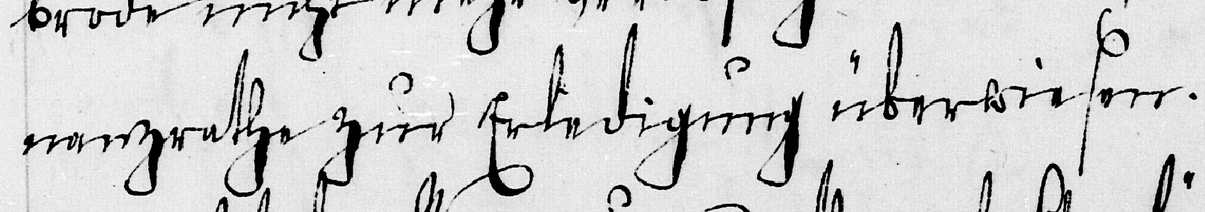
nanzrathe zur Erledigung überwiesen.
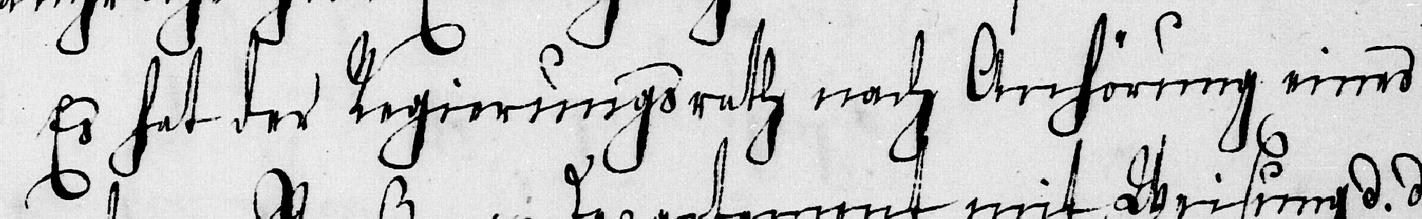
Es hat der Regierungsrath nach Anhörung eines
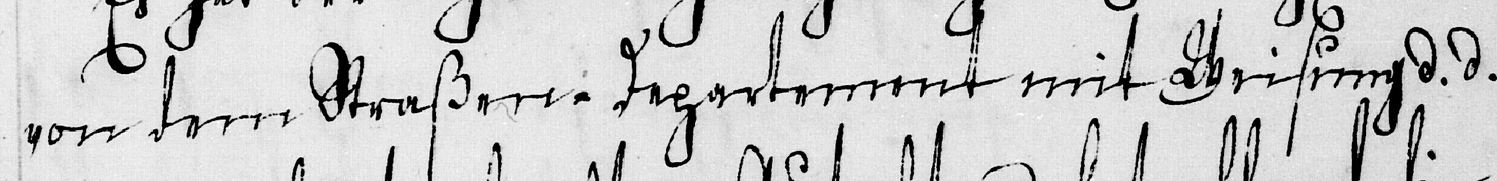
von dem Straßen-Departement mit Weisung d. d.
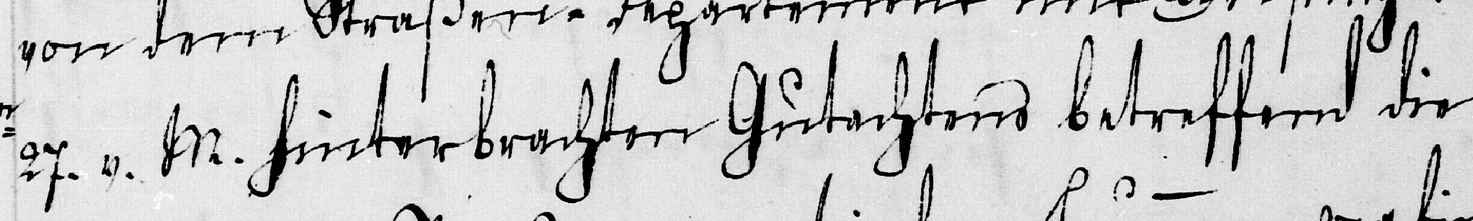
27. v. M. hinterbrachten Gutachtens betreffend die
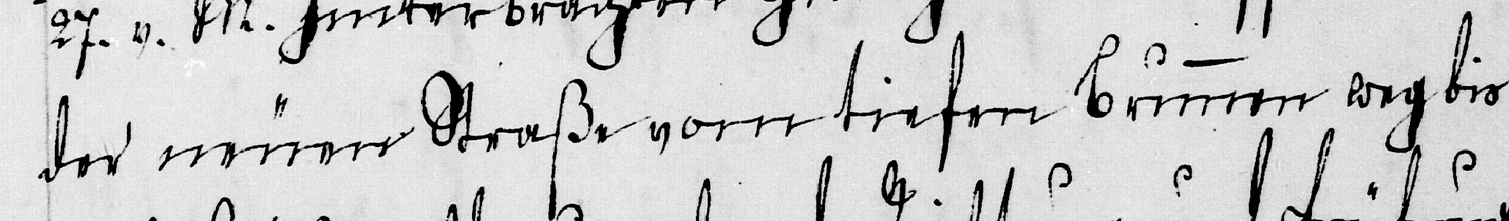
der neuen Straße von tiefen Brunnen weg bis
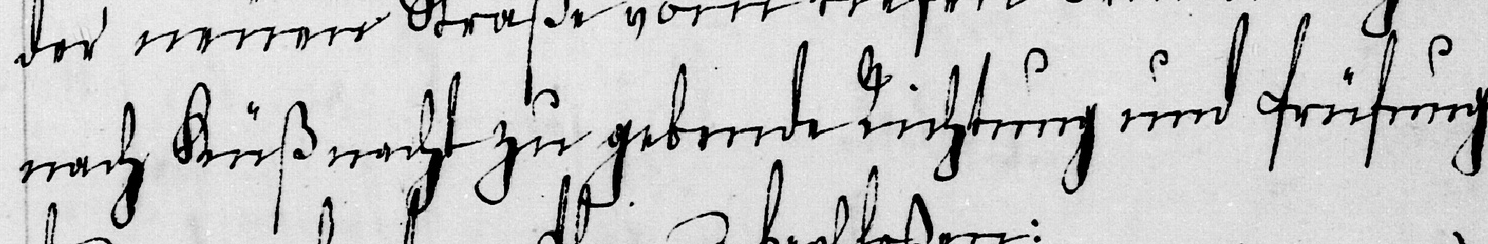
nach Küßnacht zu gebende Richtung und Prüfung
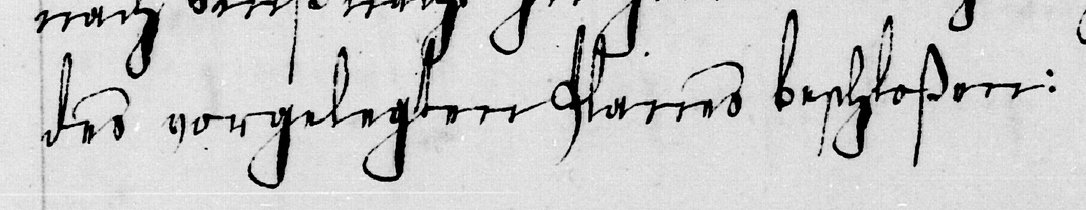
des vorgelegten Planes beschloßen:
